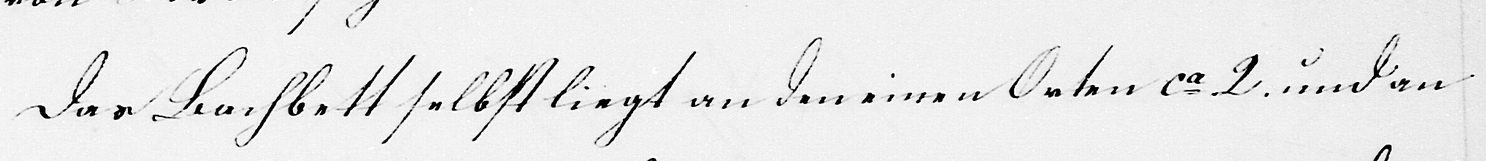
Das Bachbett selbst liegt an den einen Orten ca 2. und an
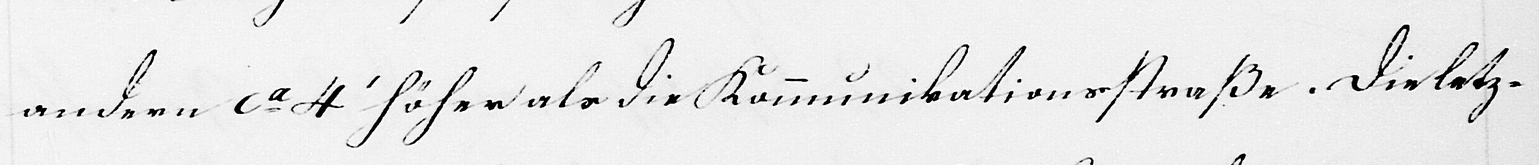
andern ca 4 [Fuss] höher als die Kommunikationsstraße. Die letz¬
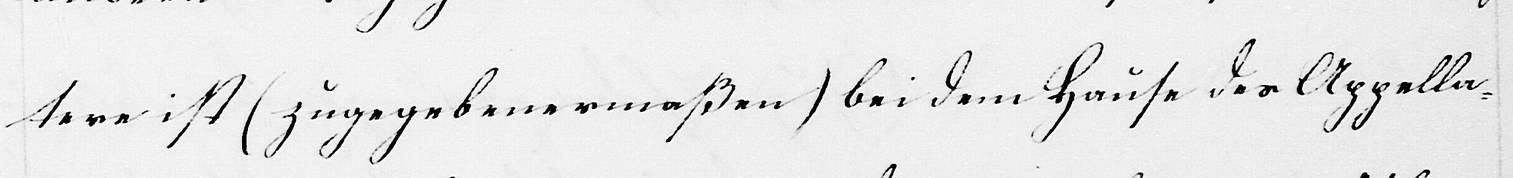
tere ist (zugegebenermaßen) bei dem Hause des Appella¬
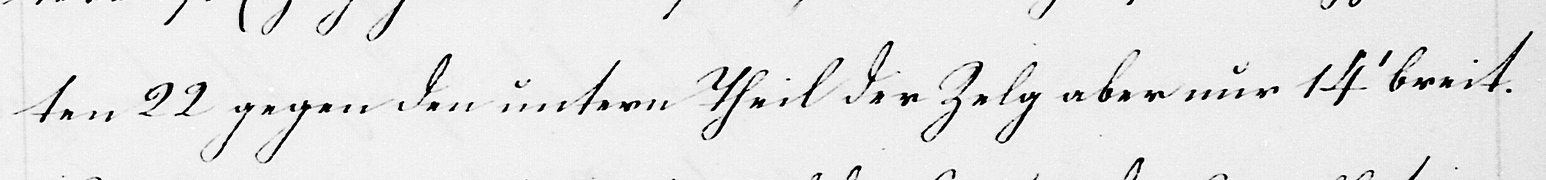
ten 22 gegen den untern Theil der Zelg aber nur 14 [Fuss] breit.
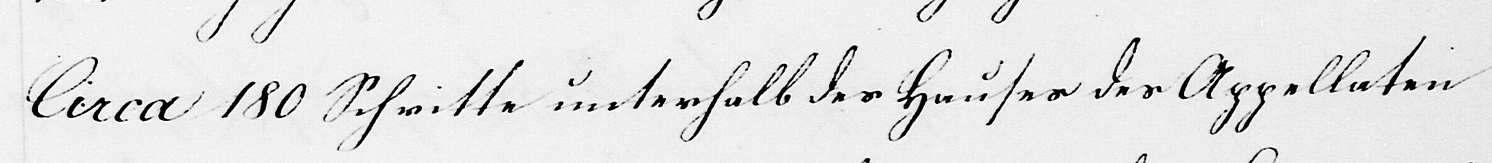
Circa 180 Schritte unterhalb des Hauses des Appellaten
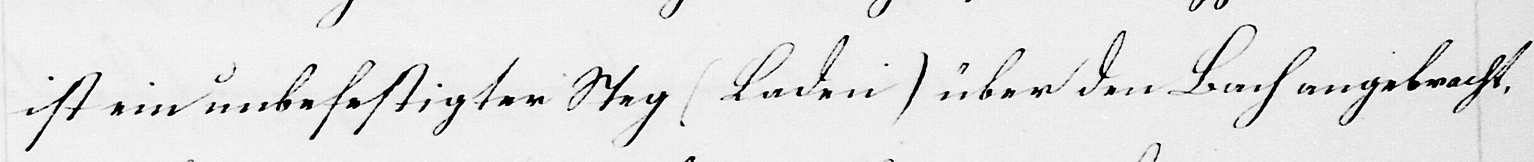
ist ein unbefestigter Steg (Laden) über den Bach angebracht,
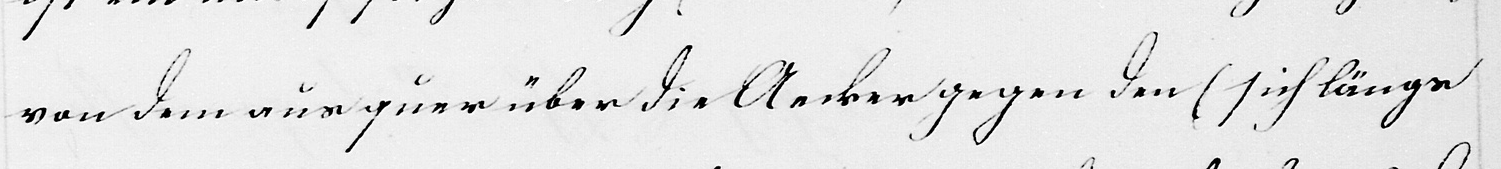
von dem aus quer über die Aecker gegen den (sich längs
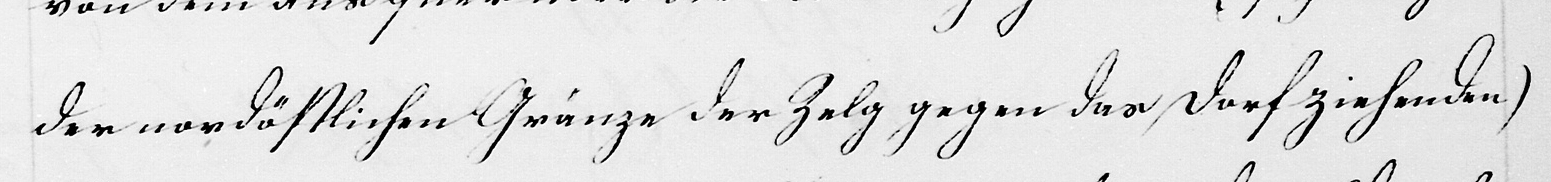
der nordöstlichen Gränze der Zelg gegen das Dorf ziehenden)
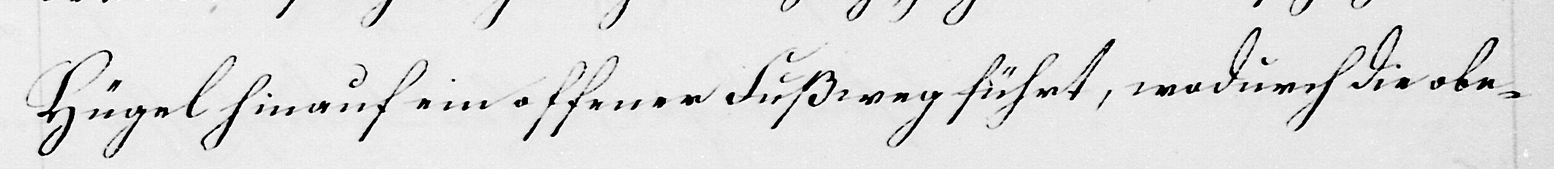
Hügel hinauf ein offener Fußweg führt, wodurch die obe-
